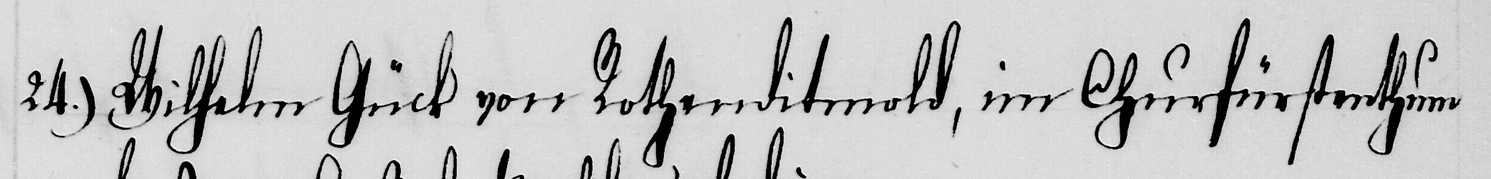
24.) Wilhelm Gück von Rothenditmold, im Churfürstenthum
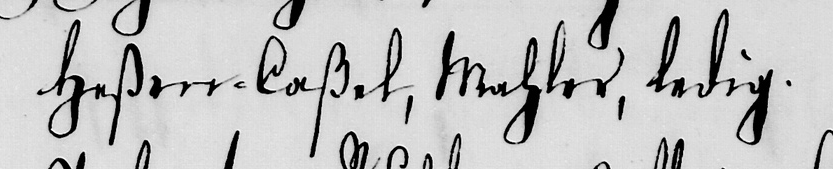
Heßen-Caßel, Mahler, ledig.
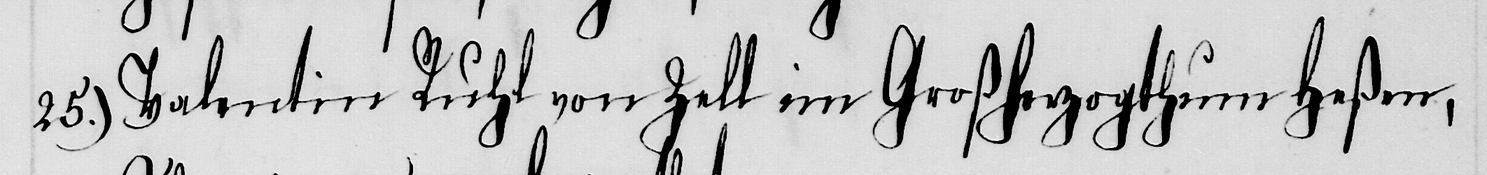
25.) Valentin Ruhl von Zell im Großherzogthum Heßen,
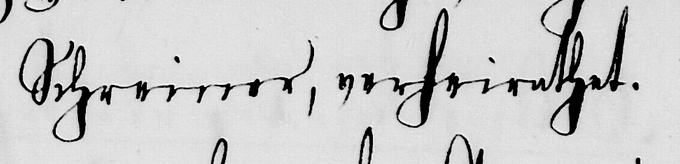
Schreiner, verheirathet.
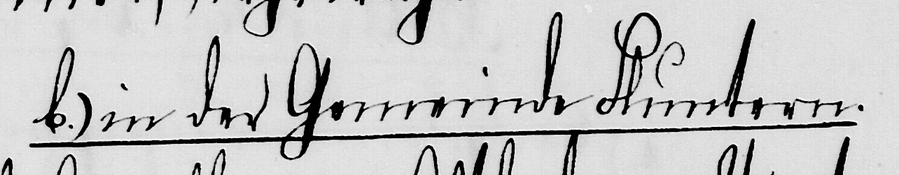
in der Gemeinde Fluntern.
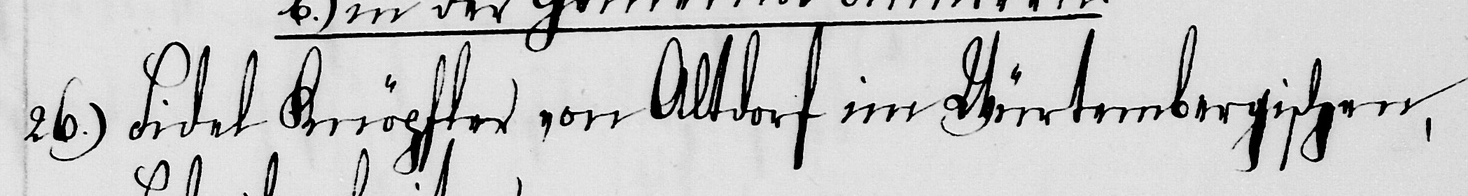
26.) Fidel Knöpfler von Altdorf im Würtembergischen,
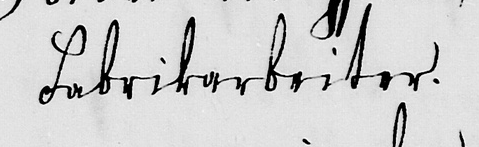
Fabrikarbeiter.
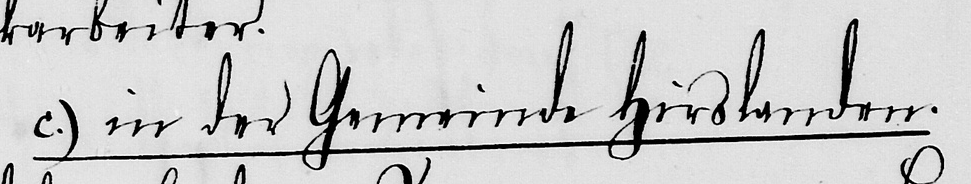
c.) in der Gemeinde Hirslanden.
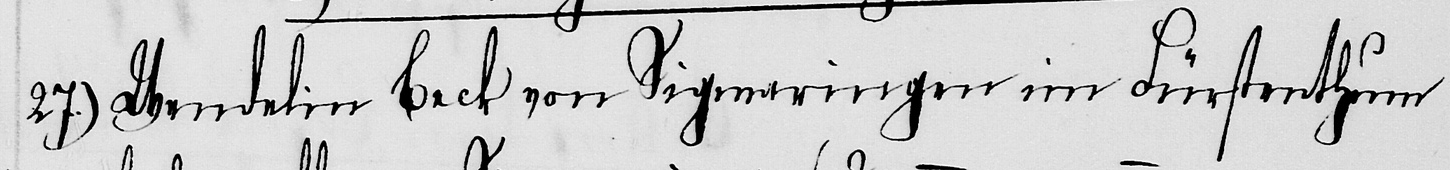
27.) Wendelin Beck von Sigmaringen im Fürstenthum
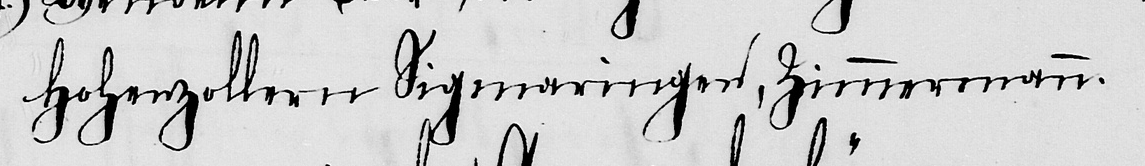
Hohenzollern Sigmaringen, Zimmermann.
